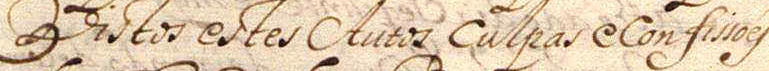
Vistos estes Autos, Culpas e Confissoés
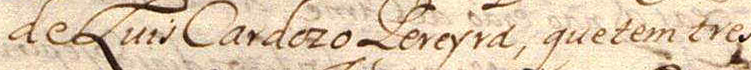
de Luis Cardozo Pereyra, que tem tres
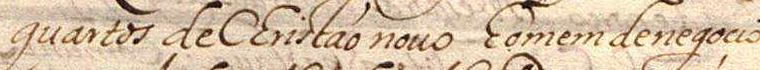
quartos de Christaõ nouo homem de negoçio
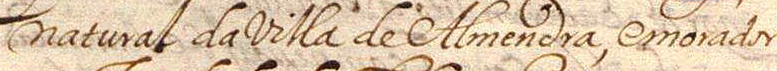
natural da Villa de Almendra, e morador
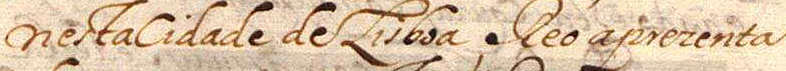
nesta Cidade de Lisboa, Reo aprezenta
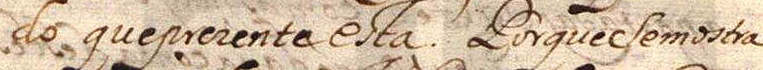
do que prezente esta. Porque se mostra
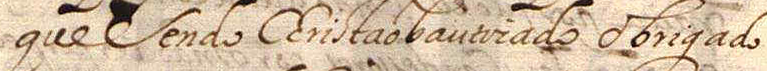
que Sendo Christaõ bautizado obrigado
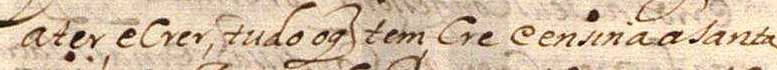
a ter, e crer, tudo o q̄ tem, Cre e ensina a santa
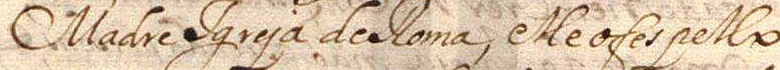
Madre Igreja de Roma, elle o fes pello
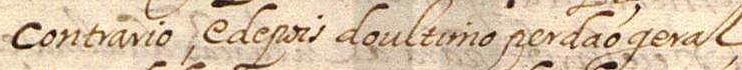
contrario, e depois do ultimo perdaõ geral,
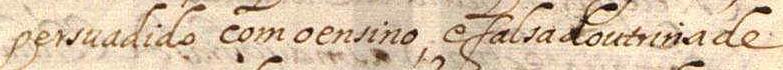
persuadido com o ensino, e falsa doutrina de
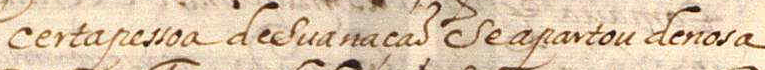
certa pessoa de sua naçaõ se apartou de nosa
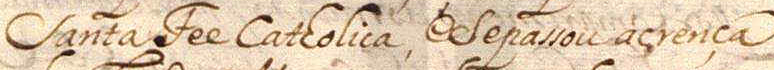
Santa Fee Catholica, e se passou a crença
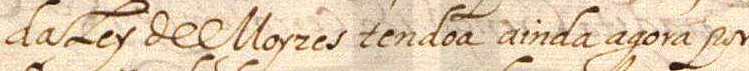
da Ley de Moyzes tendoa ainda agora por
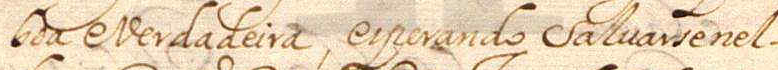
boa e verdadeira, esperando saluarse nel
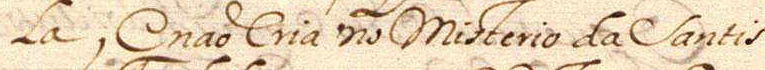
la, e naõ Cria no Misterio da Santis
